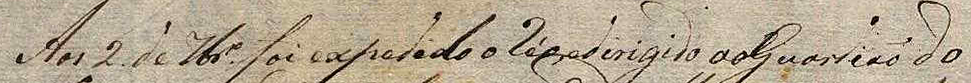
Aos 2 de 7br.o foi expedido o Réo, e dirigido ao Guardiaõ do
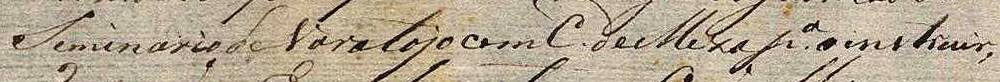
Seminario de Varatojo com C. de Meza p.a o instruir,
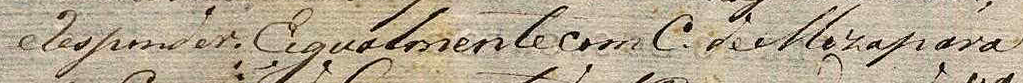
e Responder. E igualmente com C. de Meza para
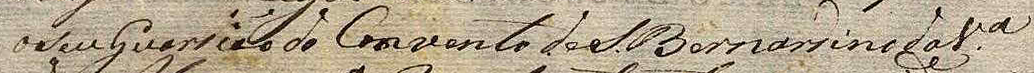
o seu Guardião do Convento de S. Bernardino da V.a
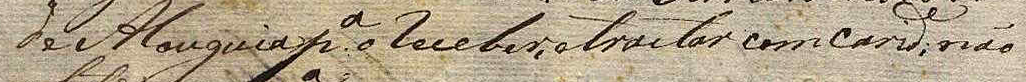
de Atouguia p.a o Receber, e tractar com caride; naõ
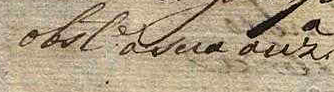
obst.e a sua auz.a
